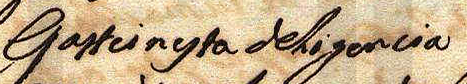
Gastei nesta deligencia
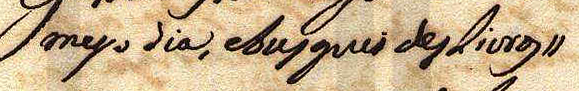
meyo dia, e busquei des Livros //
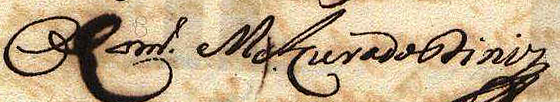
O Com.o M.el Curado Diniz
